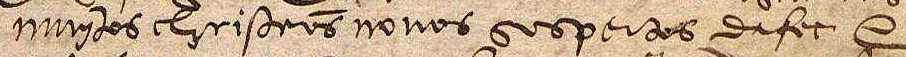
muytos christaõs nouos sospeitos da fee e
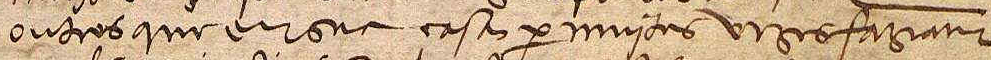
outros que em sua casa ꝑ mujtas vezes faziam
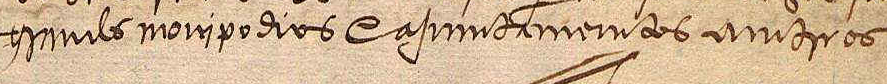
grandes monjpodios e aJumtamemtos antre os
